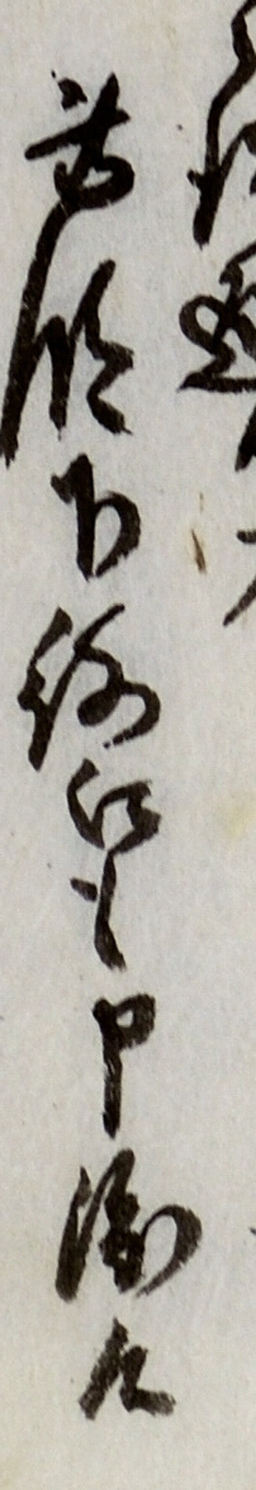此段下役えも申渡候
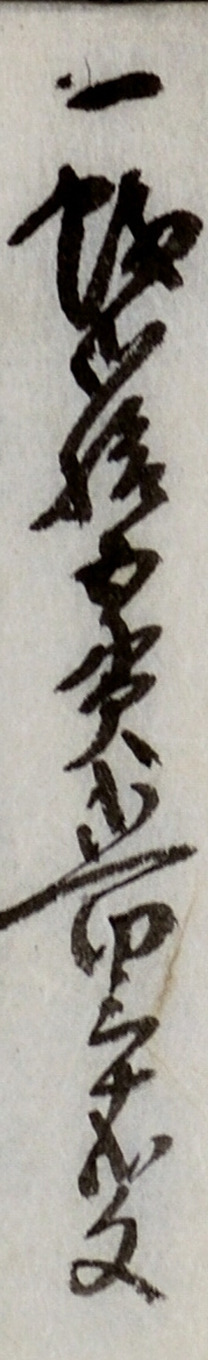一銭弐拾五貫弐百三十弐文
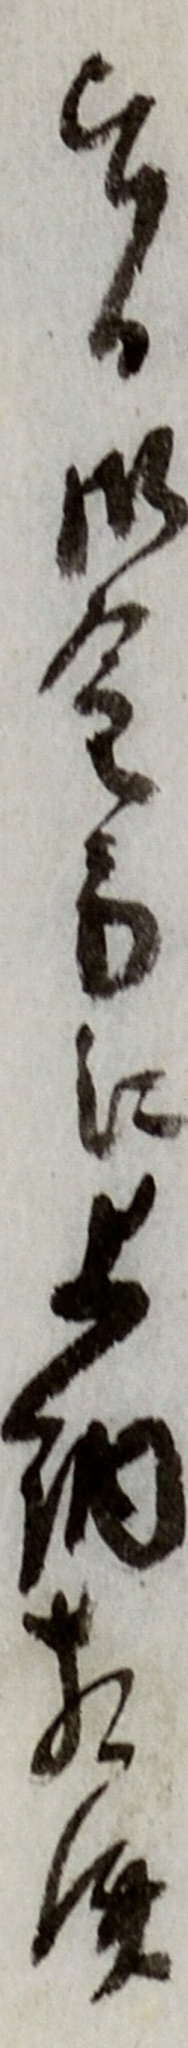今日御金方え上納相済
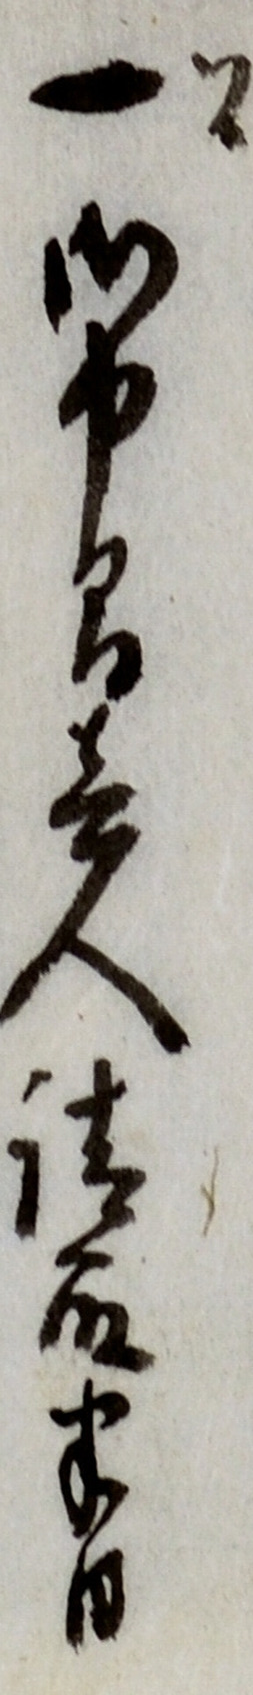一御中間壱人請取半日
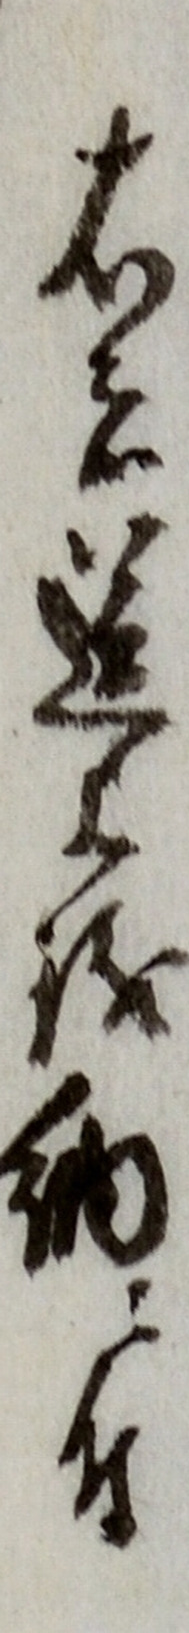右は運上銭納に付
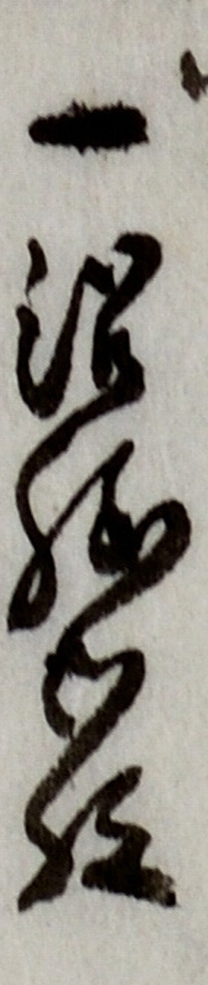一渋紙弐枚
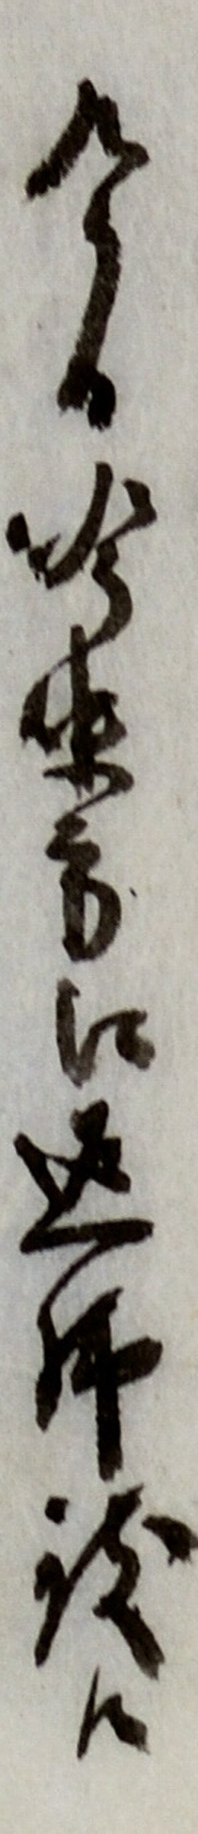今日吟味方え返却致候
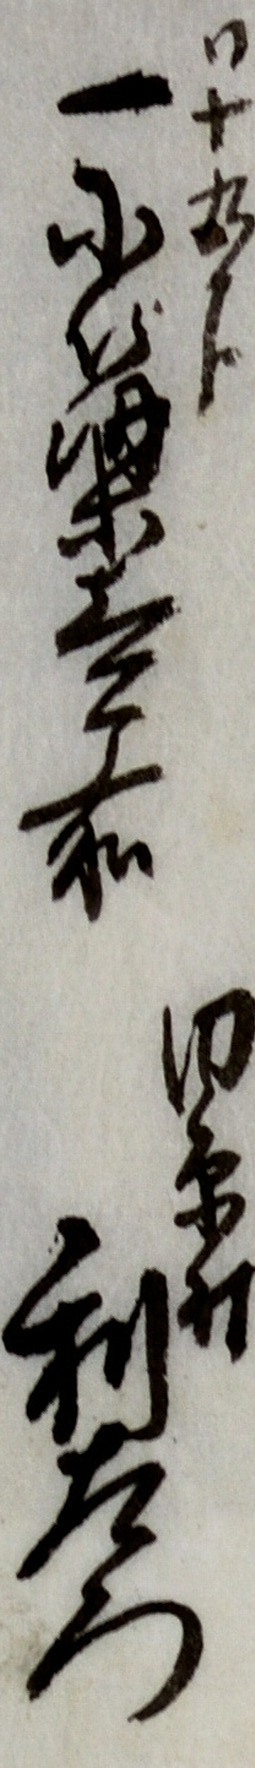一小簗壱所利左衛門
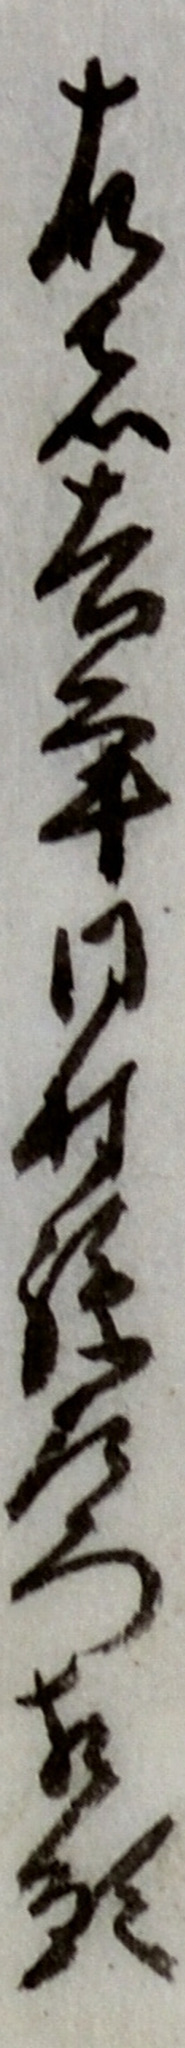右は去年同村孫左衛門相願
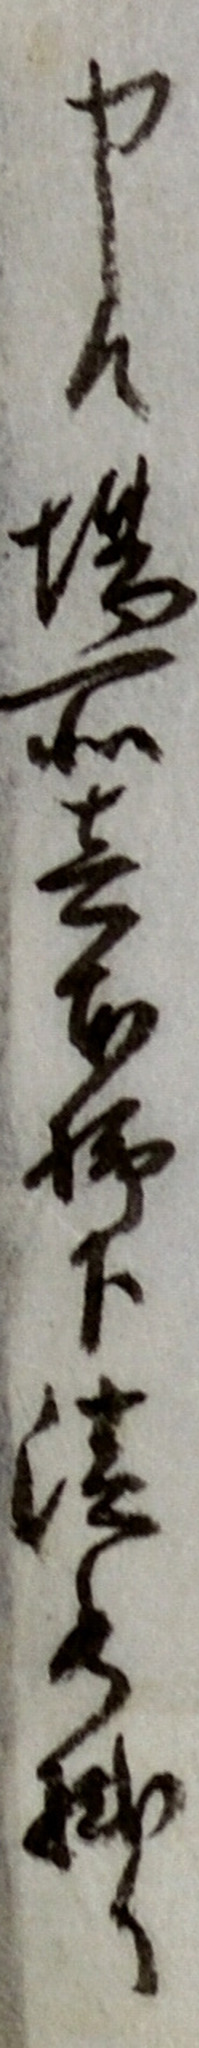申候場所壱本脚下清水掛り
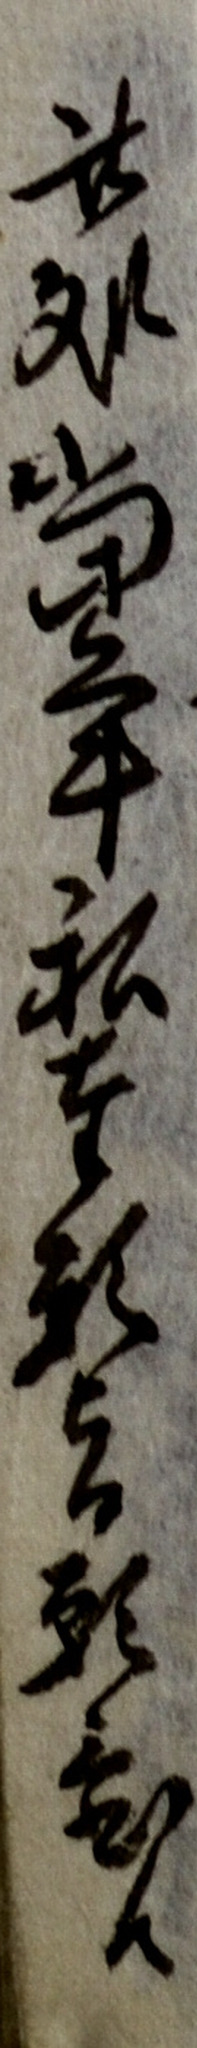此処当年私奉願旨願置候

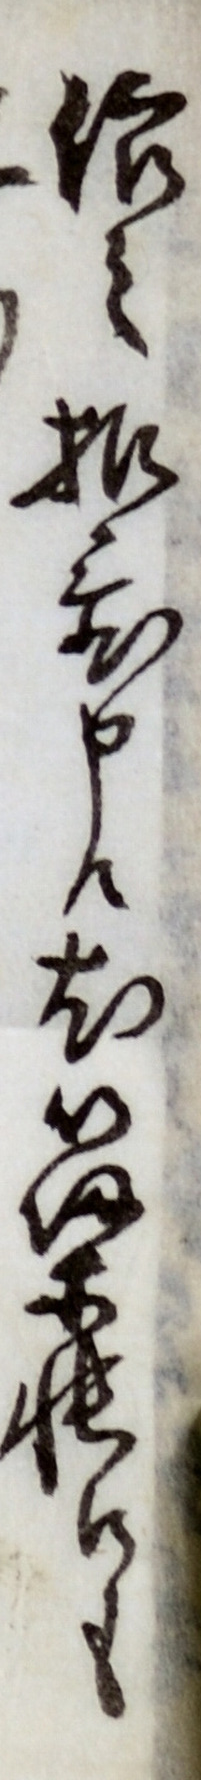依之扣置申候尤簗帳えも
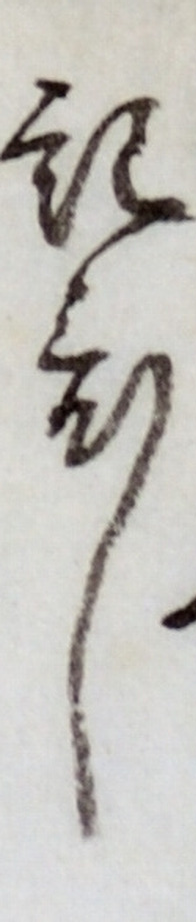記置候
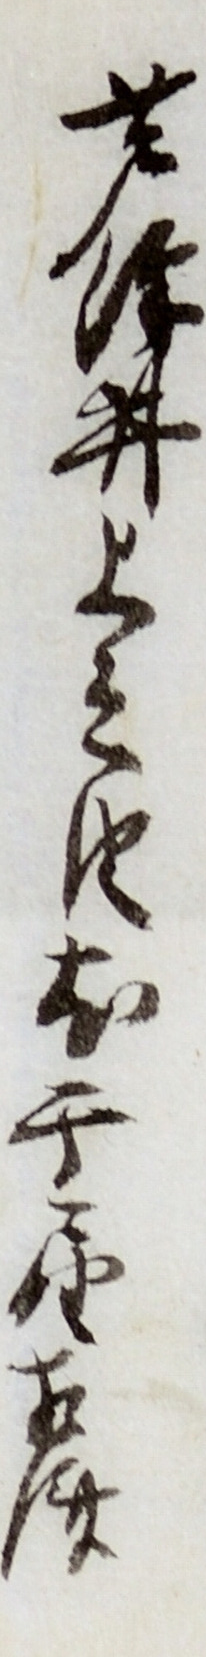芦澤井上之由尤干届相済
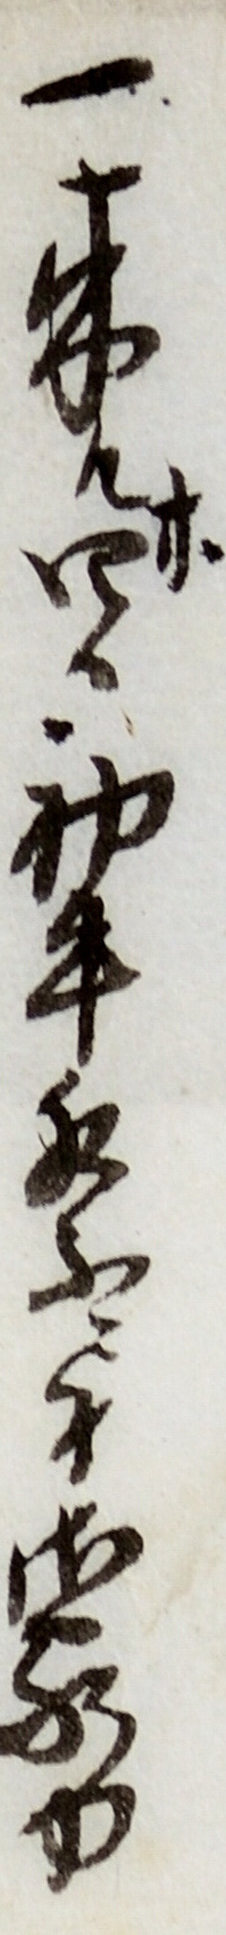一来る廿四日初午祭に付御家中
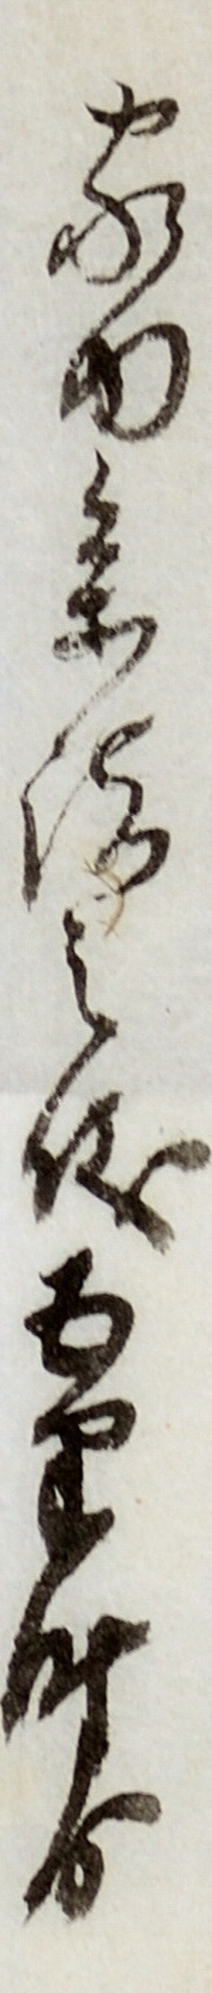家内参詣之儀五半時より
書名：諸事御用留帳
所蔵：伊那市立高遠町図書館・合同会社AMANE
